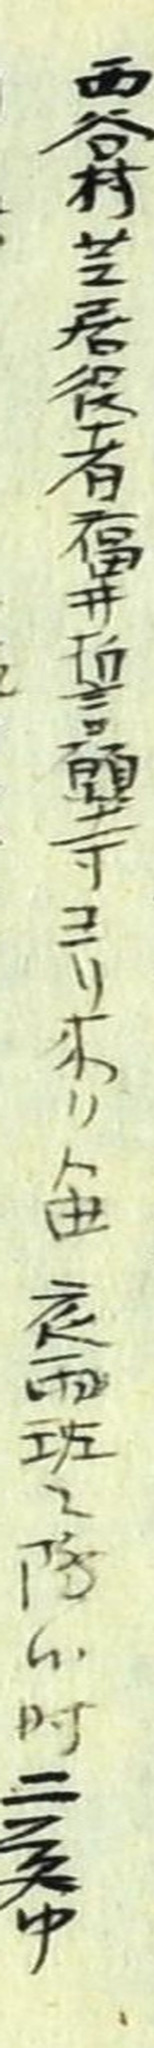西谷村芝居役者福井誓願寺ヨリ来リ候由夜雨班々降候時二幕
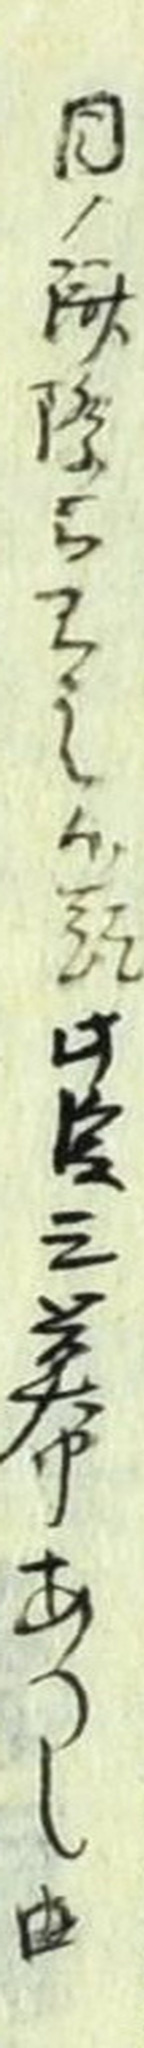目ノ済際ニ而有之候趣此後三幕ありし由
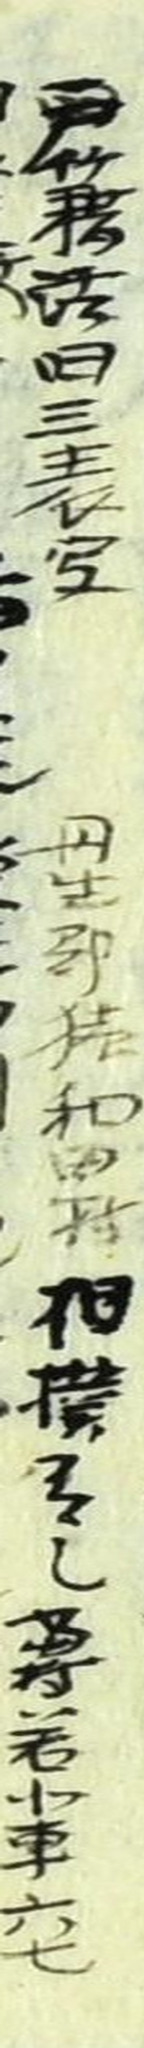戸籍法旧三表写丹生郡猿和田村相撲有之当村若輩六七
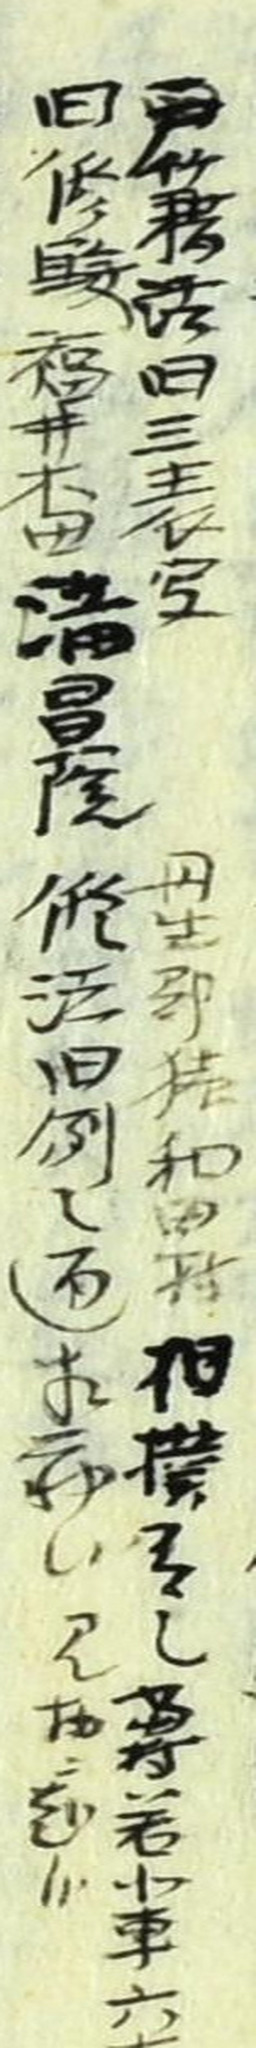旧修験福井木田満昌院修法旧例之通相勤候見物ニ赴候
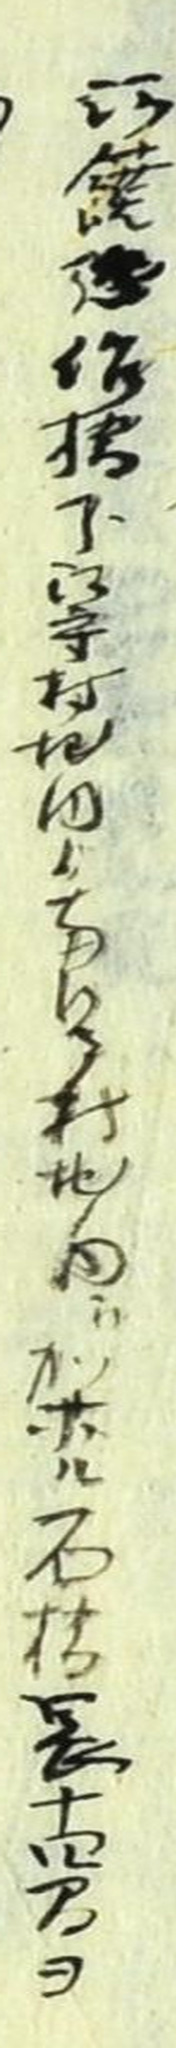河饒島作橋下江守村地内ゟ南江守村地ノ内江架ル石橋長十四間ヨ
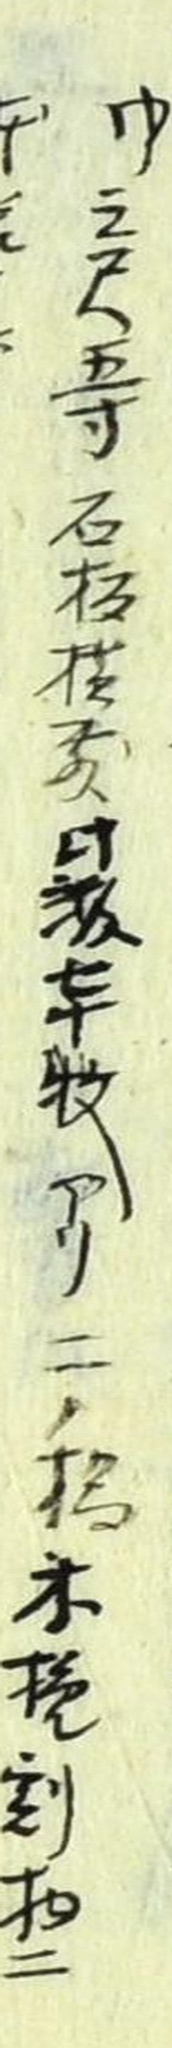幅三尺五寸石板積敷此数七十枚アリ二ノ橋木挽割物二
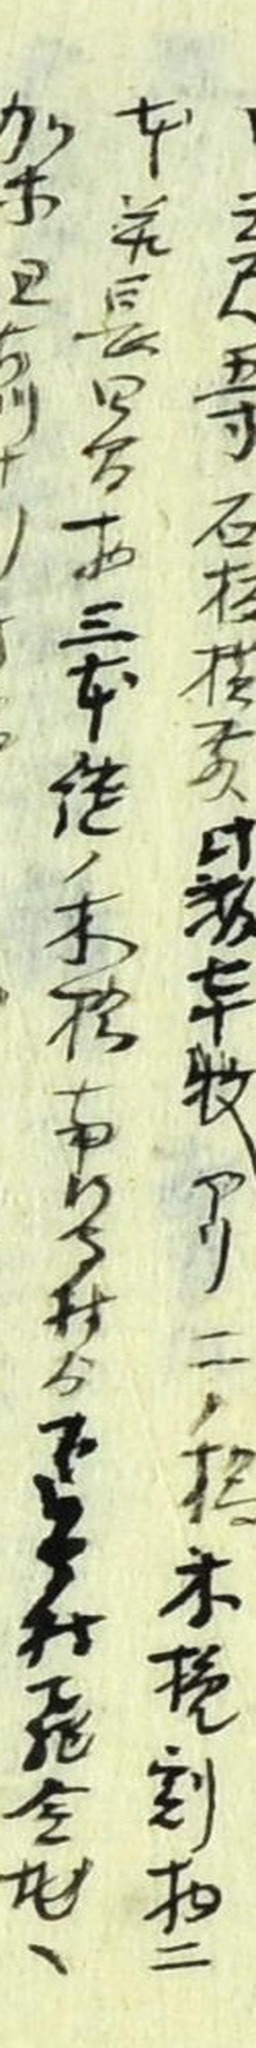本幷長四間物三本継ノ木橋南江守村ゟ下江守村飛会地へ
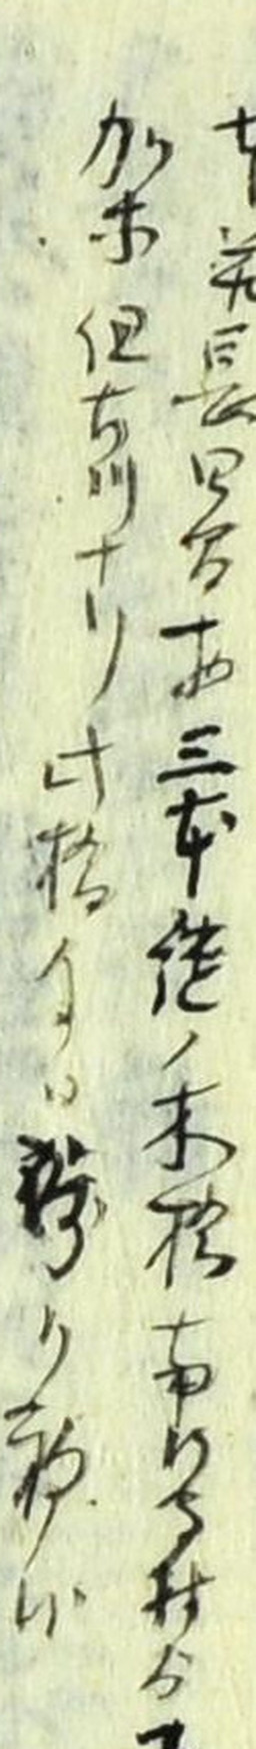架但古川ナリ此橋月日防リ勤候
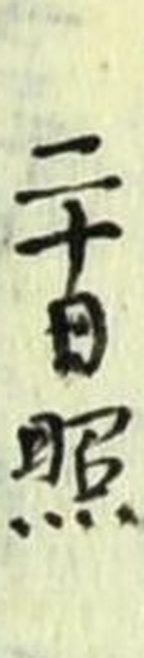二十日照
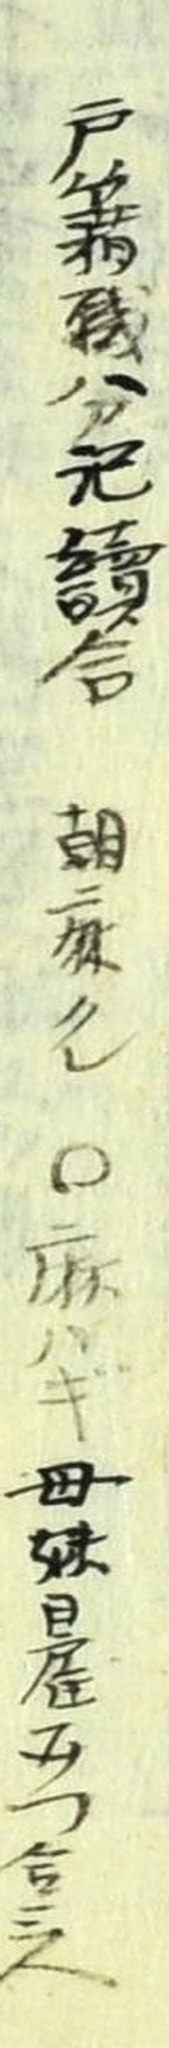戸籍職分記読合朝麻クレ○麻ハギ母妹日雇みつ合三人
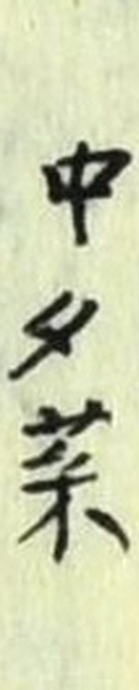中夕菜
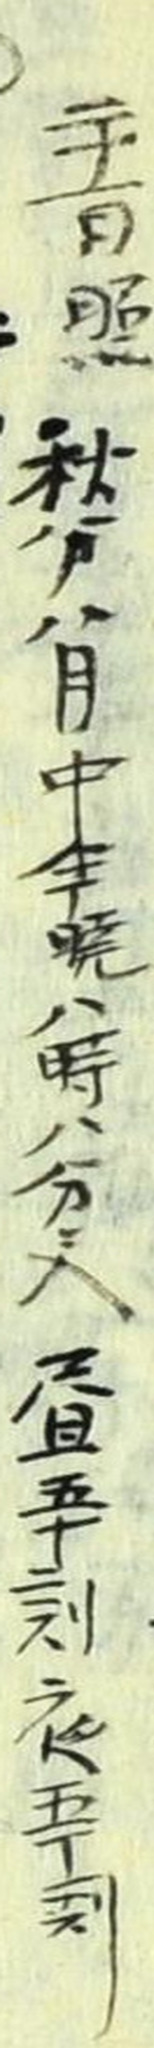二十一日照秋分八月中今暁八時八分ニ入昼五十刻夜五十刻
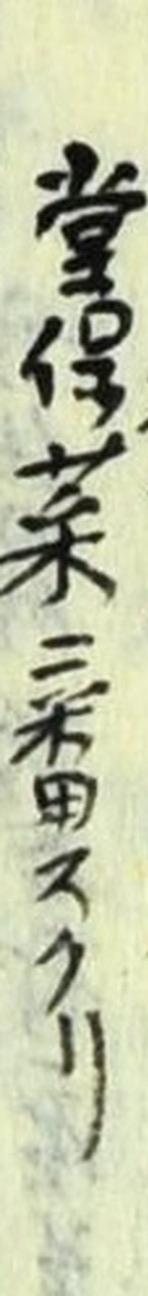○堂保菜二番スクリ
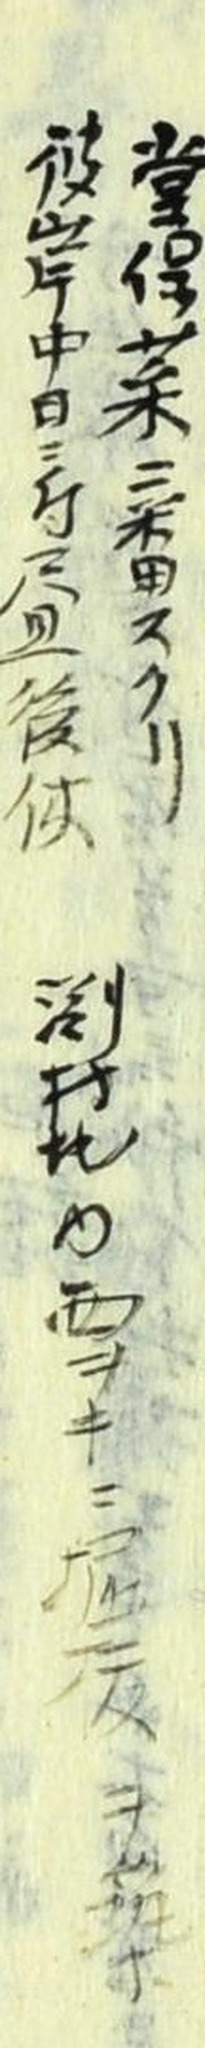彼岸中日ニ付昼後休淵村地内西ヲキニ堀板ヲ築
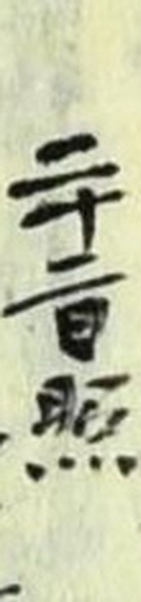二十二日照
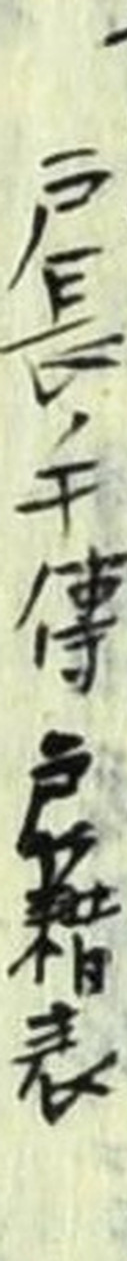戸長手伝戸籍表
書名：（日記）
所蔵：福井県文書館 Fukui Prefectural Archives
